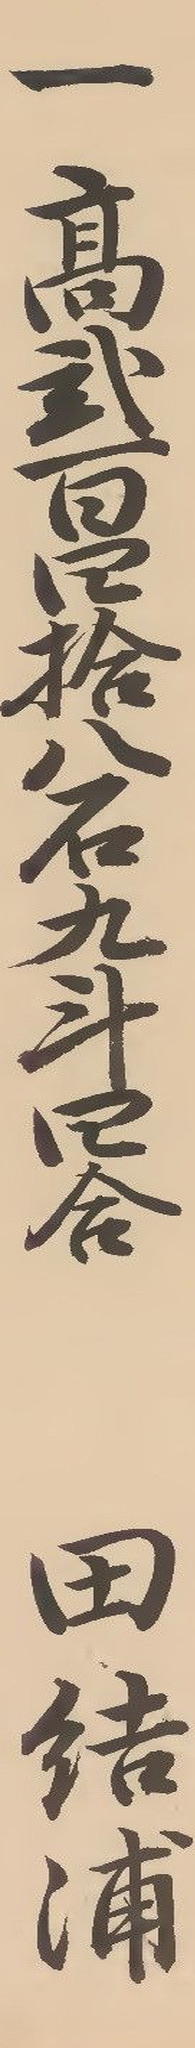一高弐百四拾八石九斗四合田結浦
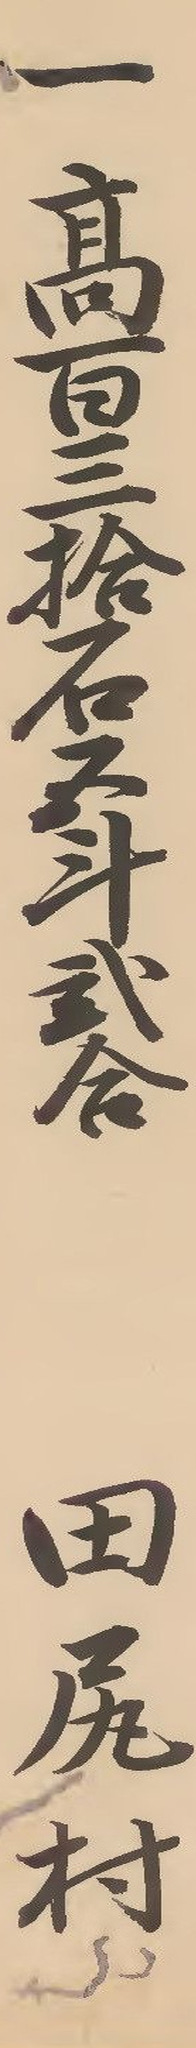一高百三拾石五斗弐合田尻村

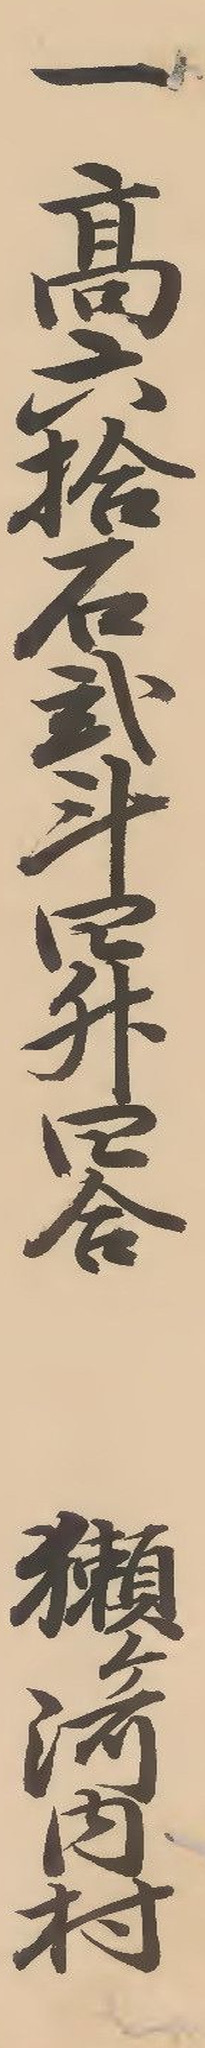一高六拾石弐斗四升四合獺ヶ河内村
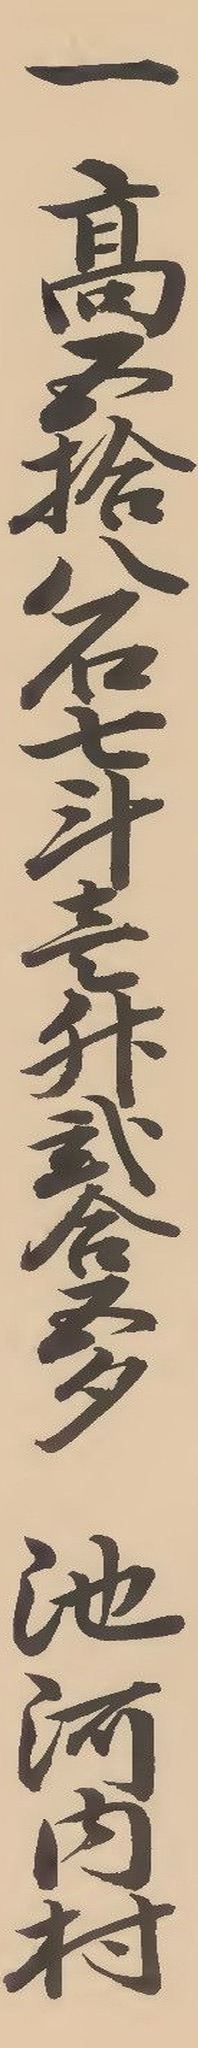一高五拾八石七斗壱升弐合五勺池河内村
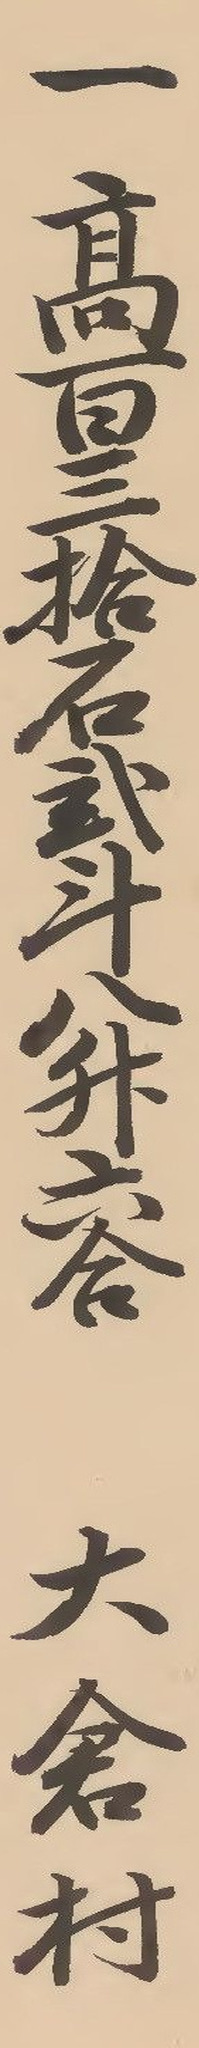一高百三拾石弐斗八升六合大倉村
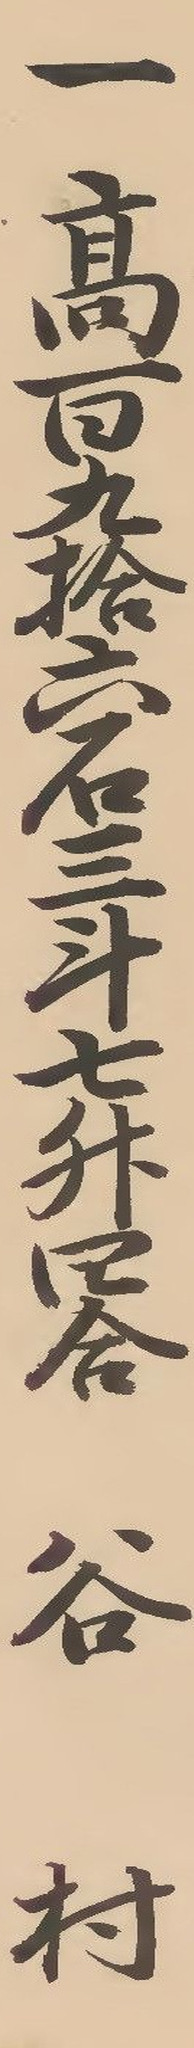一高百九拾六石三斗七升四合谷村
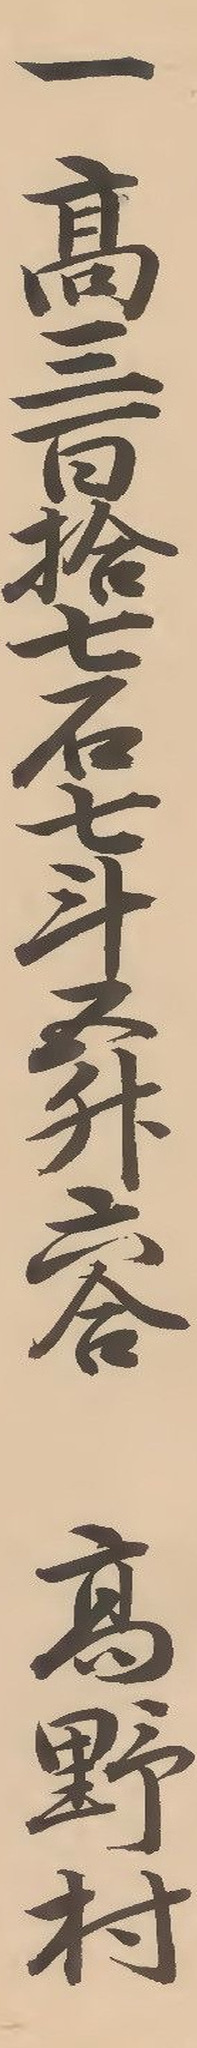一高三百拾七石七斗五升六合高野村
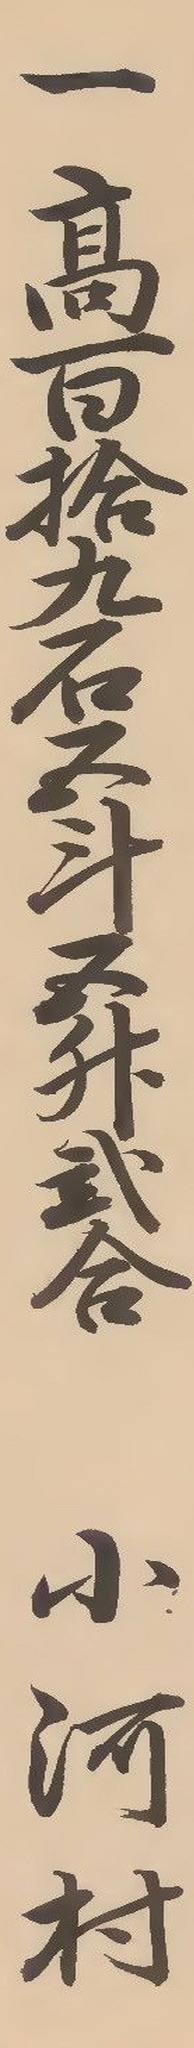一高百拾九石五斗五升弐合小河村
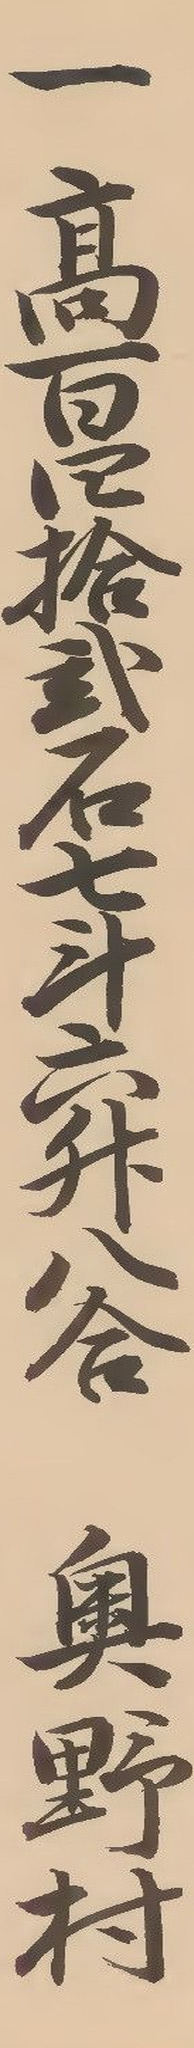一高百四拾弐石七斗六升八合奥野村
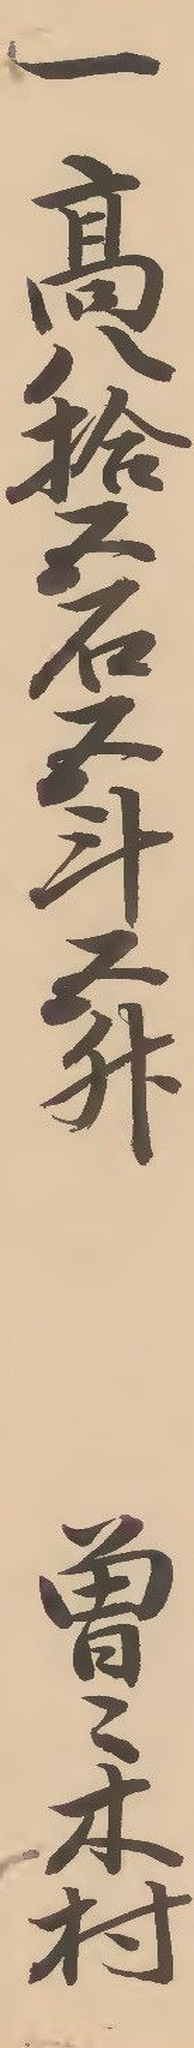一高八拾五石五斗五升曽々木村

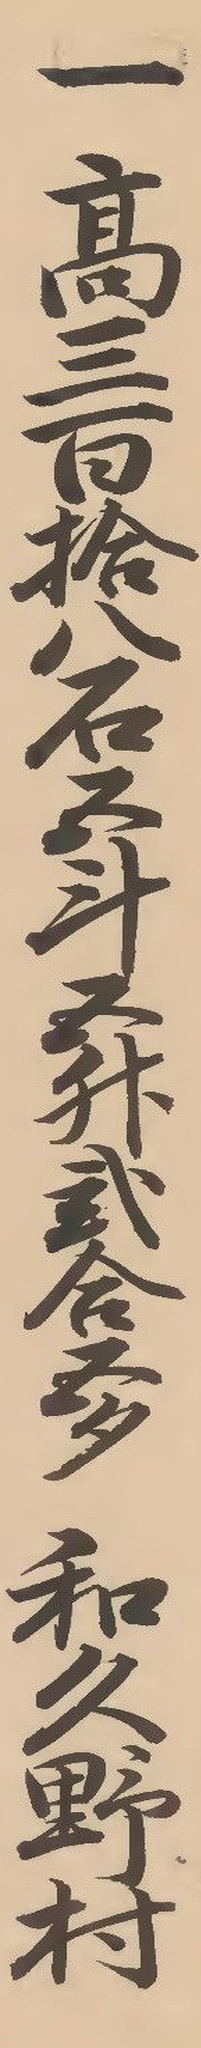一高三百拾八石五斗五升弐合五勺和久野村
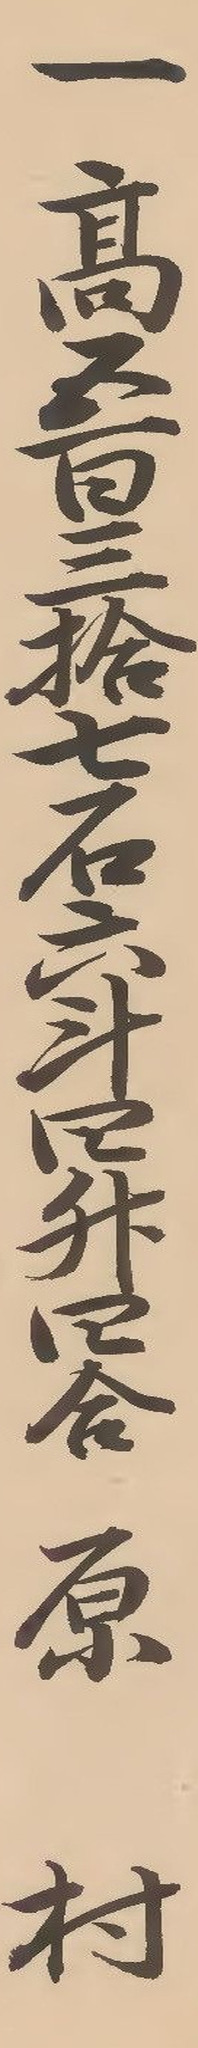一高五百三拾七石六斗四升四合原村
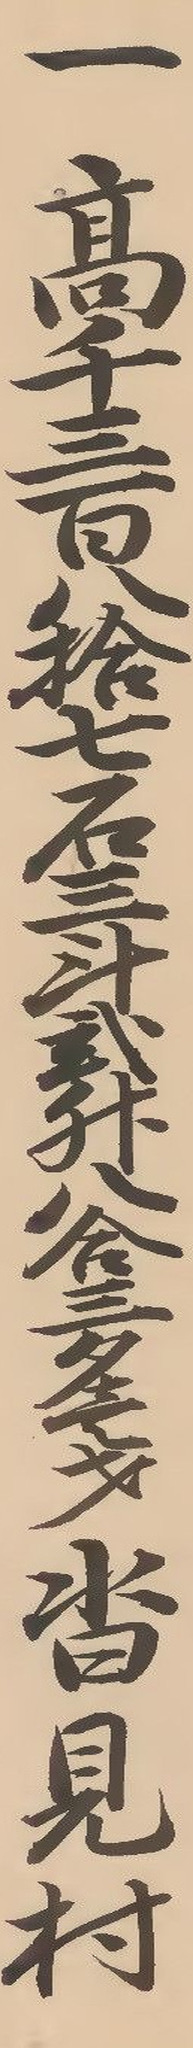一高千三百八拾七石三斗弐升八合三勺壱才沓見村
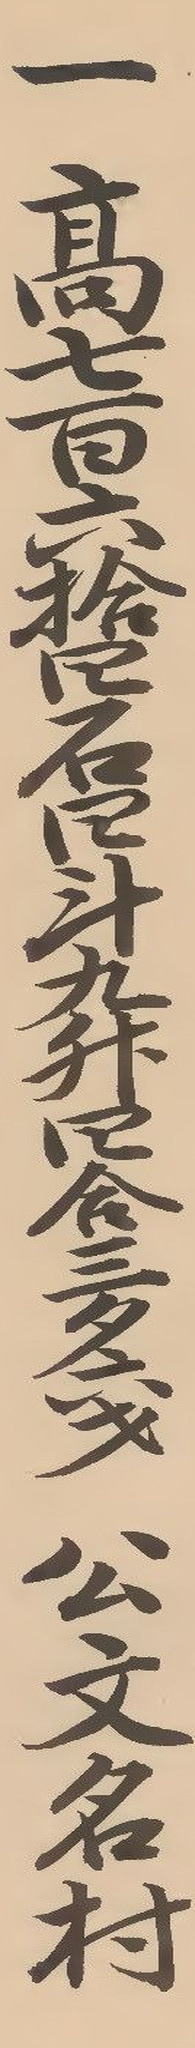一高七百六拾四石四斗九升四合三勺六才公文名村
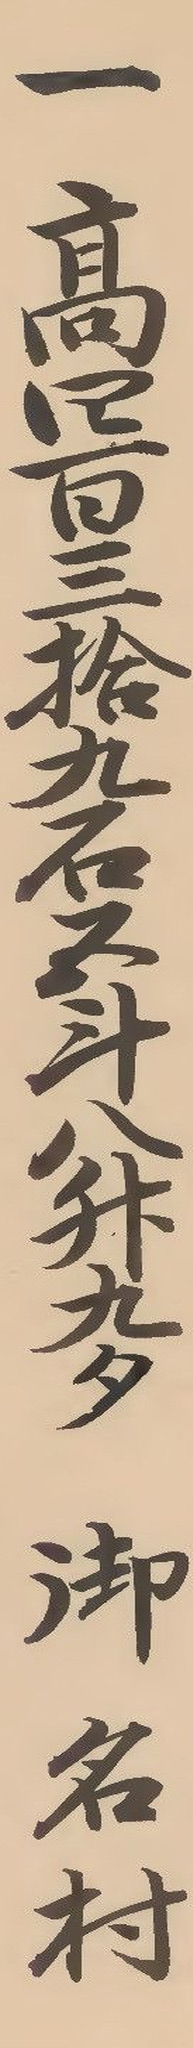一高四百三拾九石五斗八升九勺御名村
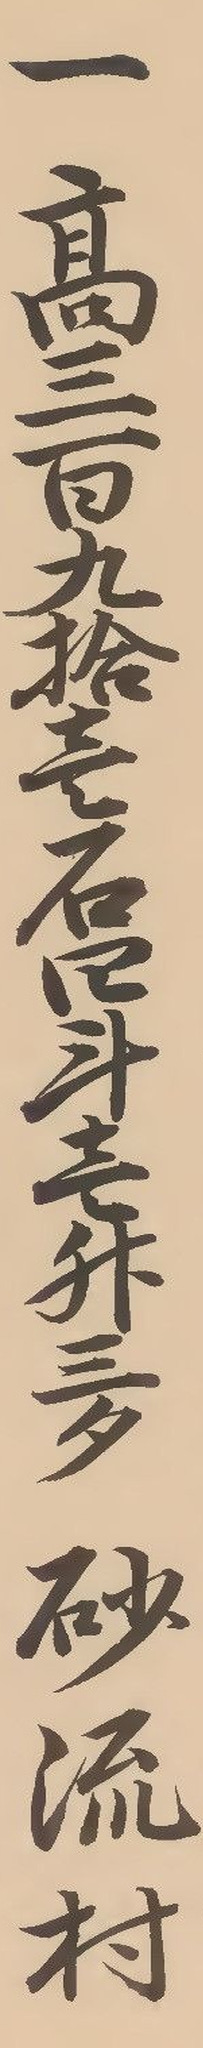一高三百九拾壱石四斗壱升三勺砂流村
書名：越前国郷帳
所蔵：国立公文書館 National Archives of Japan
